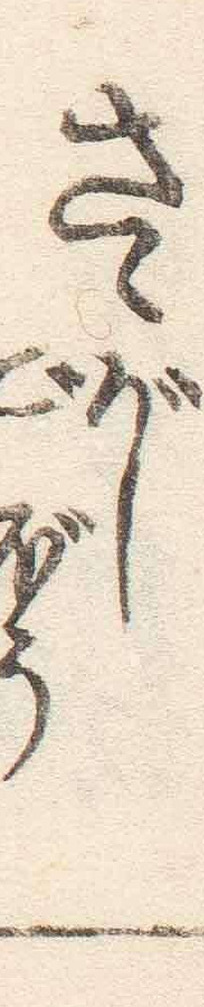さゝがし皮
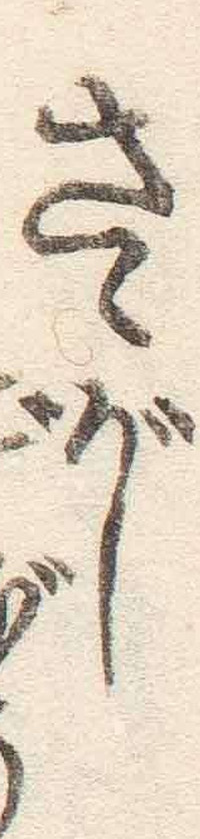さゝがし皮
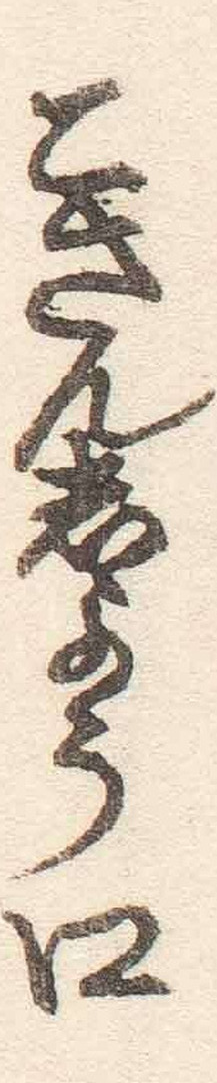こさんしようえ
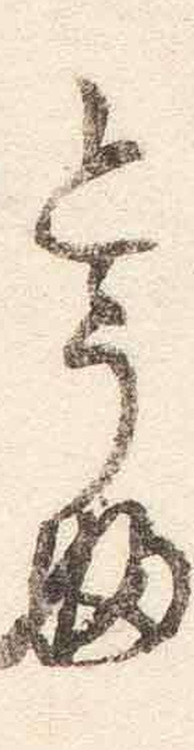とう腐
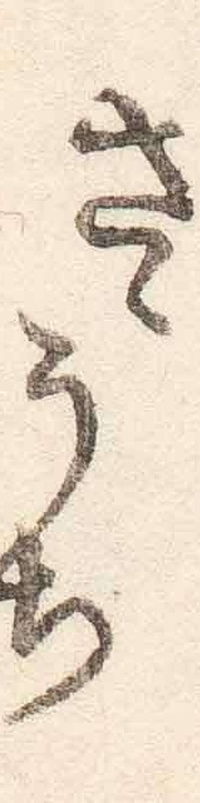さゝうち
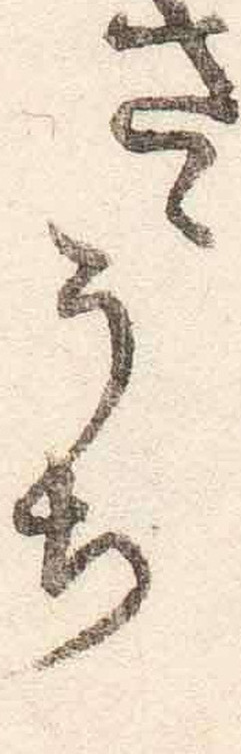さゝうち
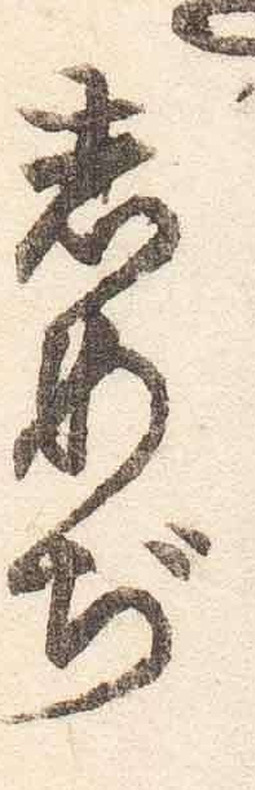しめぢ
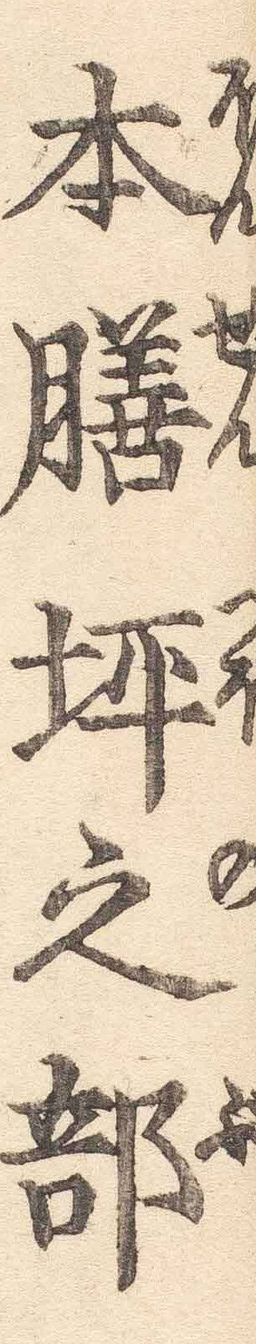本膳坪之部
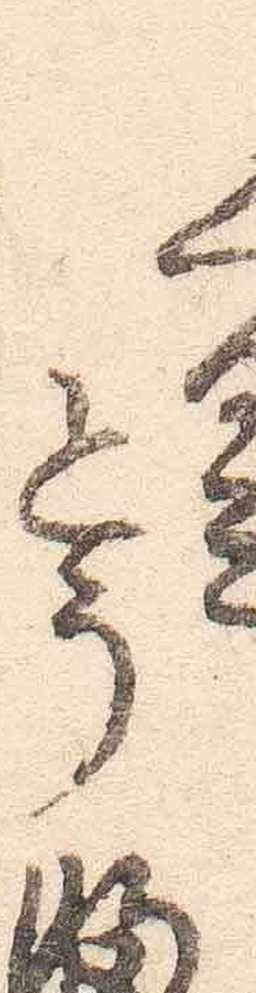とう腐
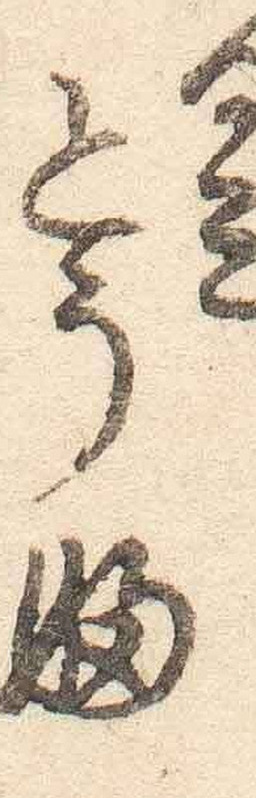とう腐
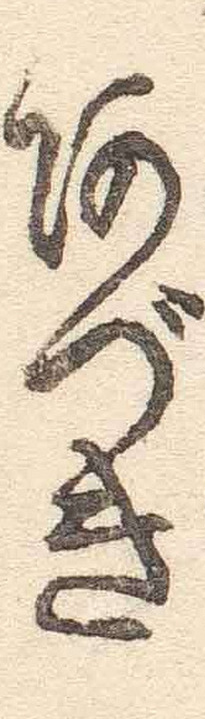あづき
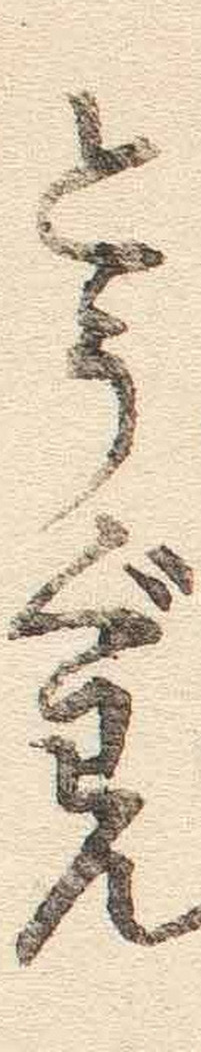とうぐわん

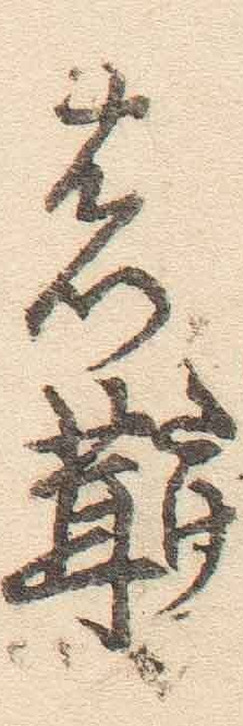はつ茸
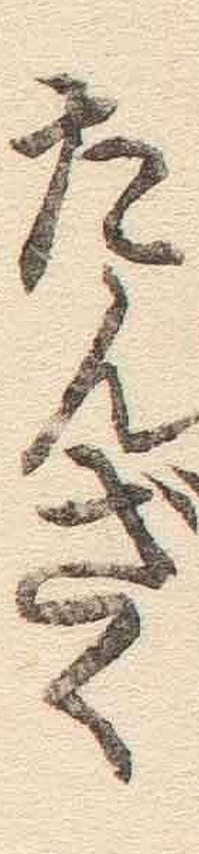たんざく
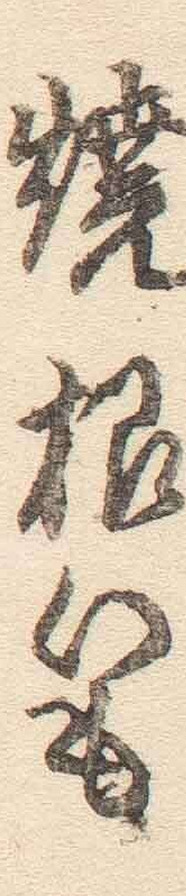焼根いも
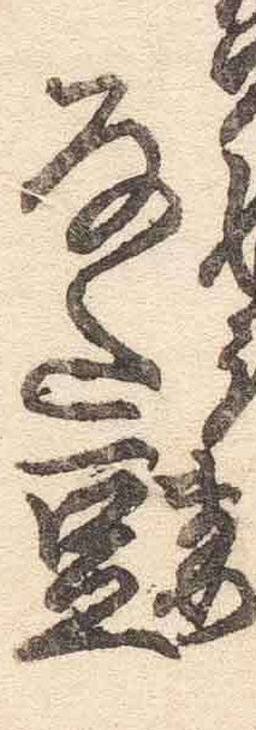なた豆
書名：料理通
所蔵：東京学芸大学附属図書館 国文学研究資料館
